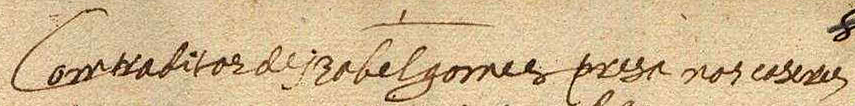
Comtraditas de jzabel gomes presa nos caseres
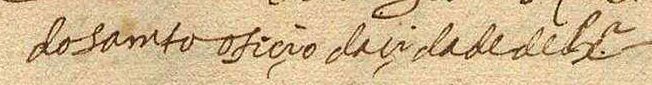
do samto oficio da cidade de lx.a
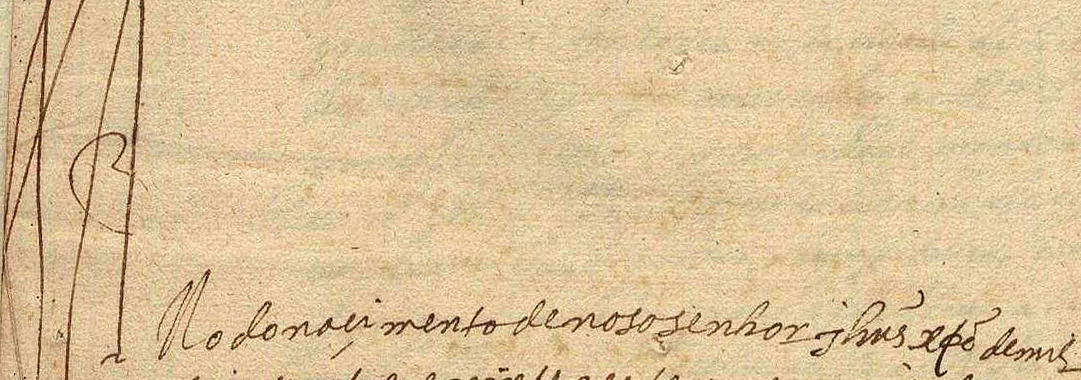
ANo do nacimento de noso senhor jhūs xpō de mil
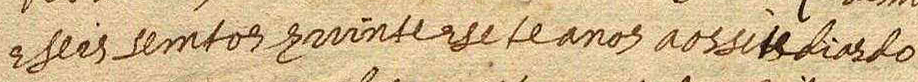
E seissemtos E uinteEe sete anos aos sete dias do
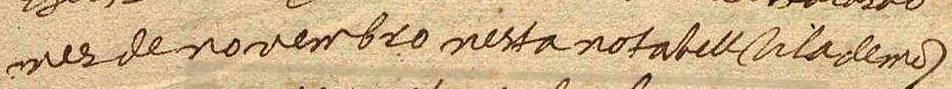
mes de novembro nesta notavell Vila de mō
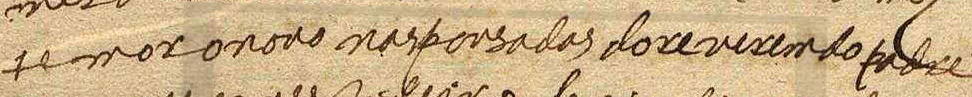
temor o nouo nas pousadas do reveremdo padre
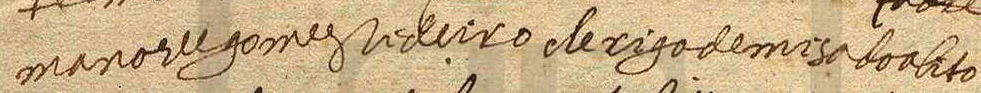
manoEll gomes videiro clerigo de misa do abito
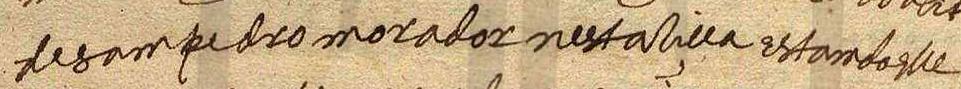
de sam pedro morador nesta villa Estamdo Elle
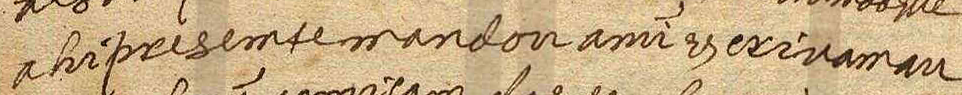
ahi presemte mandou a mī Escriuam au
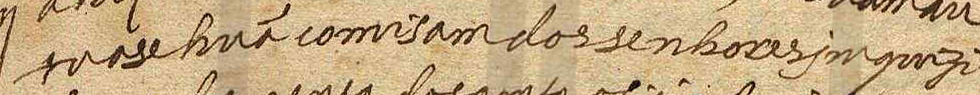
tuase huā comisam dos senhores jmquizi
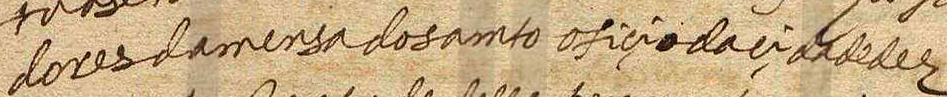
dores da mensa do samto ofiçio da cidade de E
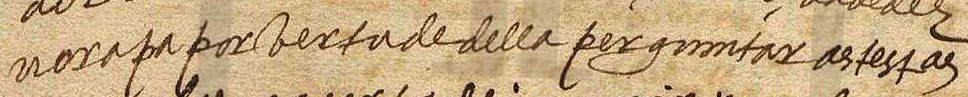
uora pa por vertude della pergumtar as testas
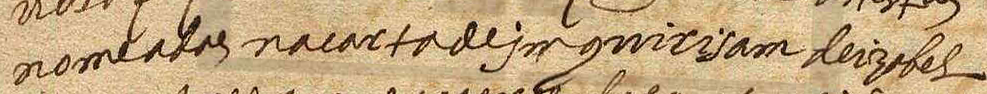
nomeadas na carta de jmquirisam de izabel
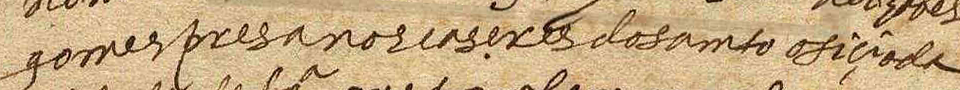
gomes presa nos caseres do samto oficio da
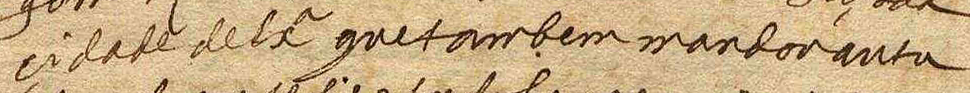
cidade de lxa que tambem mandou autu
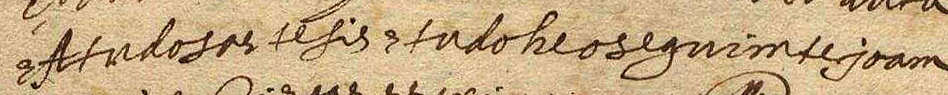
E A tudo sastefis E tudo he o seguimte joam
